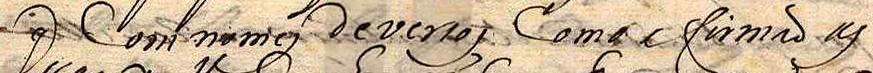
q̄ Com nomes deversos, Como afirmaõ as
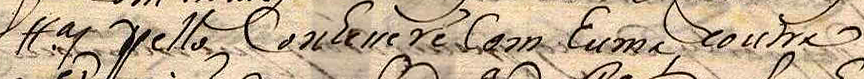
tt.as pello Conhesserē Com huma, e outra
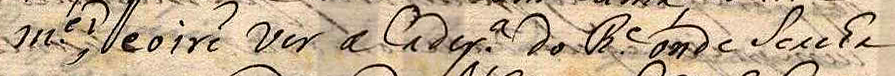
m.er, e o irē ver a Cadey.a do R.e onde se acha
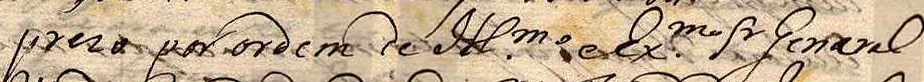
prezo por ordem de Ill.mo e Ex.mo S.r Genaral
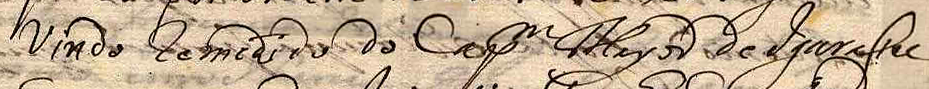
Vindo Remetido do Cap.m Mayor de Igarassu
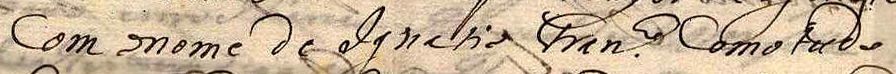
Com o nome de Ignasio Fran.co Como tudo
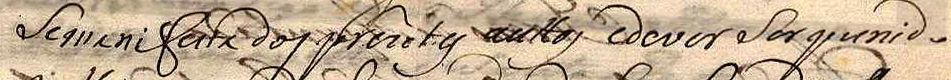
Se manifesta dos prezētes auttos e dever Ser punido
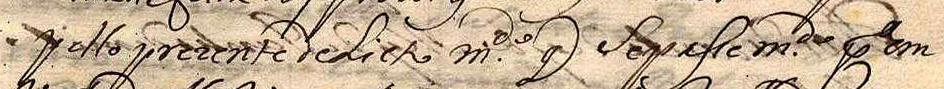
pello prezente deLicto m.do q̄ se passe m.do p.a em
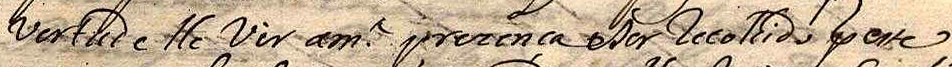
vertude lhe vir a m.a prezença e ser Recolhido p̄ este
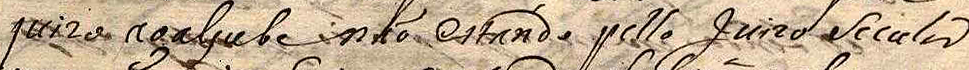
juizo ao aljube naõ estando pello Juizo secular
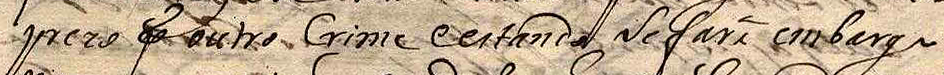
prezo p̄ outro Crime e estando se fará embargo
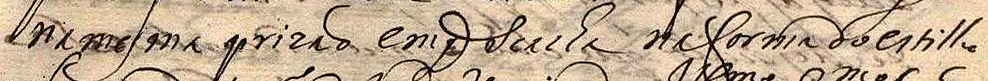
na mesma prizaõ em q̄ se acha na forma do estillo
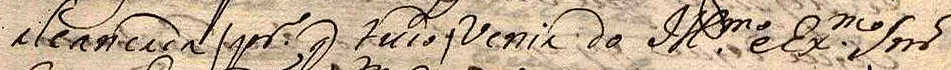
alcançada (pr̄. q̄ tudo) venia do Ill.mo e Ex.mo Snr̄
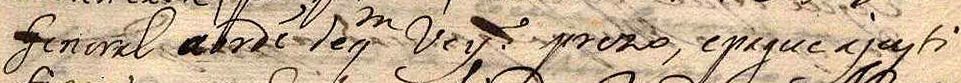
General a ordē de q.m Vey.o prezo, e pague a justi
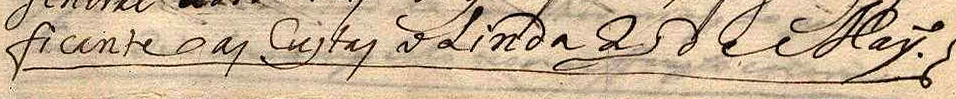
ficante as Custas oLinda 2 de May.o
